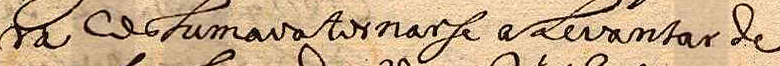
ra costumava tornarse a Levantar de
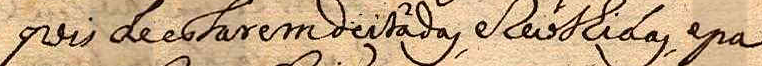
pois de estarem deitadas, e Recolhidas, e pa
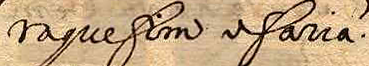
ra que fim o fazia?
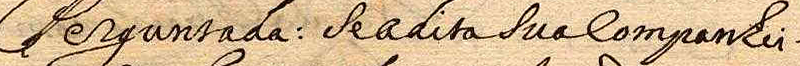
Perguntada: se a dita sua companhei
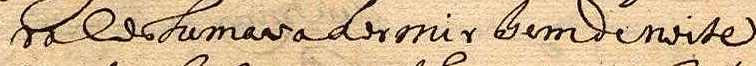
ra costumava dormir bem de noite,
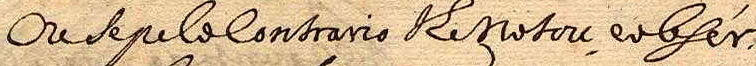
Ou se pelo contrario lhe notou, e obser.
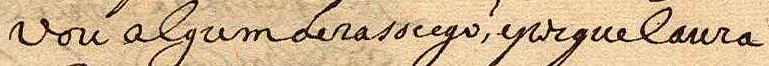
vou algum dezasocego? e por que cauza?
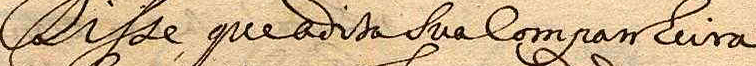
Disse, que a dita sua companheira
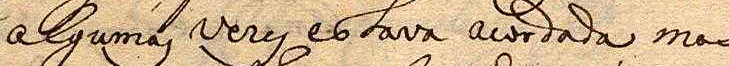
algumas vezes estava acordada, mas
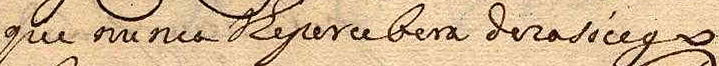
que nunca lhe percebera dezasocego
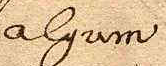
algum.
